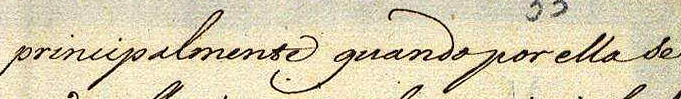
principalmente quando por ella se
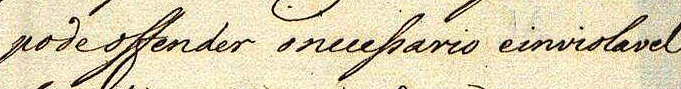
pode offender o necessario e inviolavel
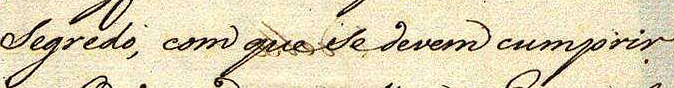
Segredo, com que se devem cumprir
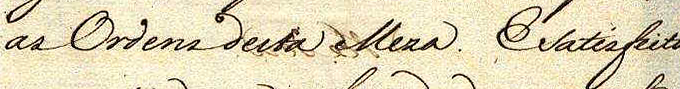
a Ordens desta Meza. E satisfeito
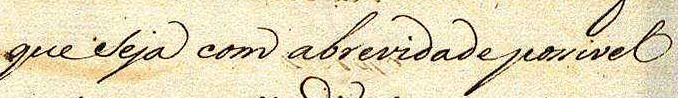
que seja com a brevidade possivel
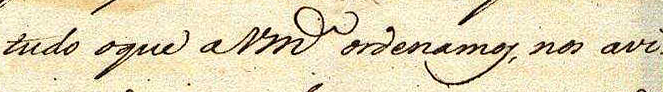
tudo o que a v m.e ordenamos, nos avi
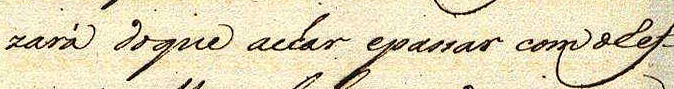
zará do que achar e passar com o Ref
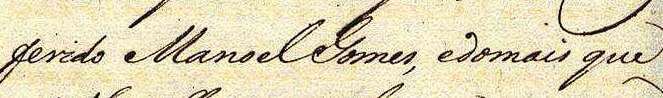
ferido Manoel Gomes, e do mais que
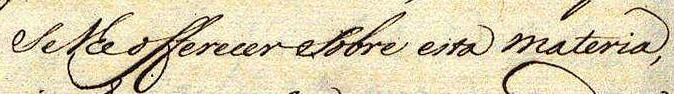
selhe offerecer sobre esta materia,
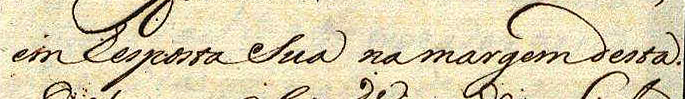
em Resposta sua na margem desta.
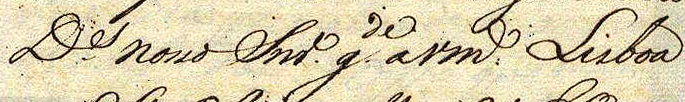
D.es nosso Snr̄. g.de a v m.e Lisboa
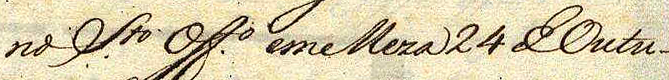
no S.to Off.o em Meza 24 d̄ Outu
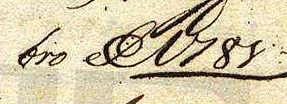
bro d̄ 1781
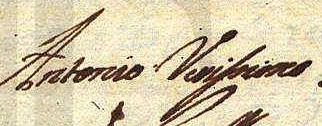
Antonio Verissimo
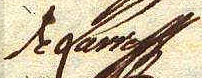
de Larre
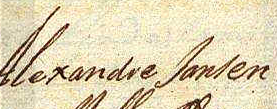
Alexandre Iansen
